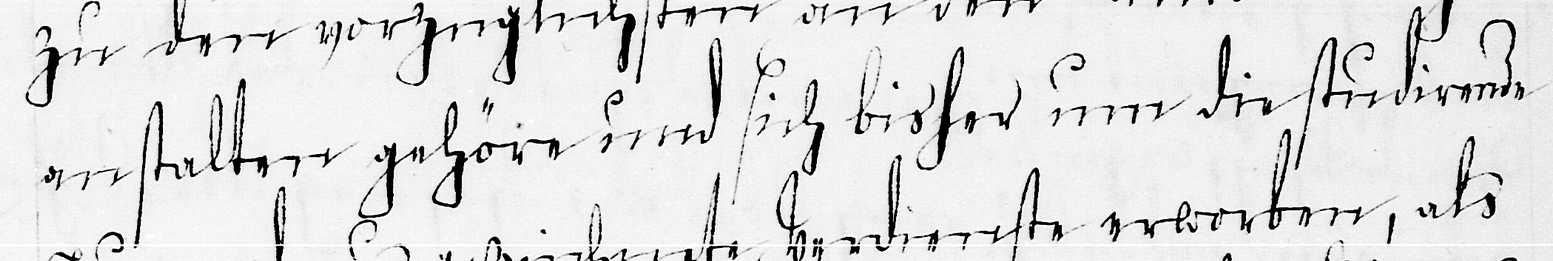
anstalten gehöre und sich bisher um die studirende
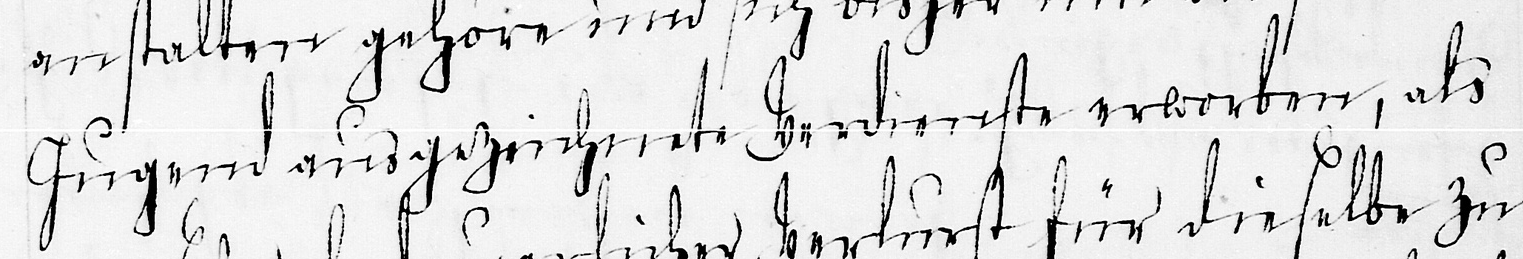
Jugend ausgezeichnete Verdienste erworben, als
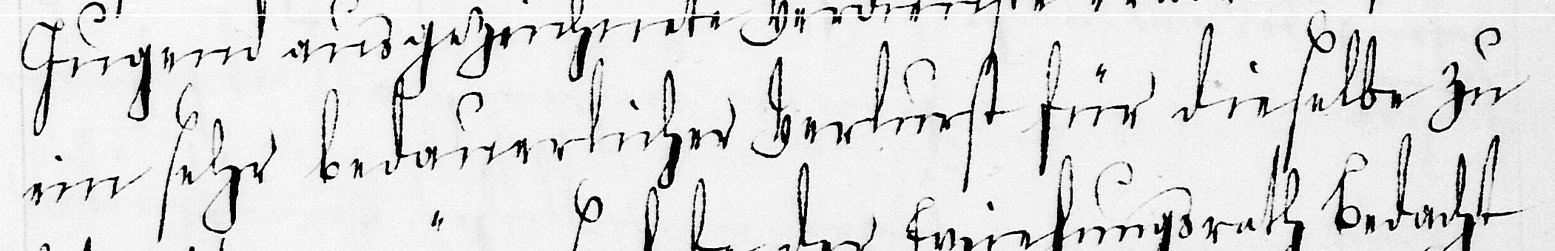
ein sehr bedauerlicher Verlust für dieselbe zu
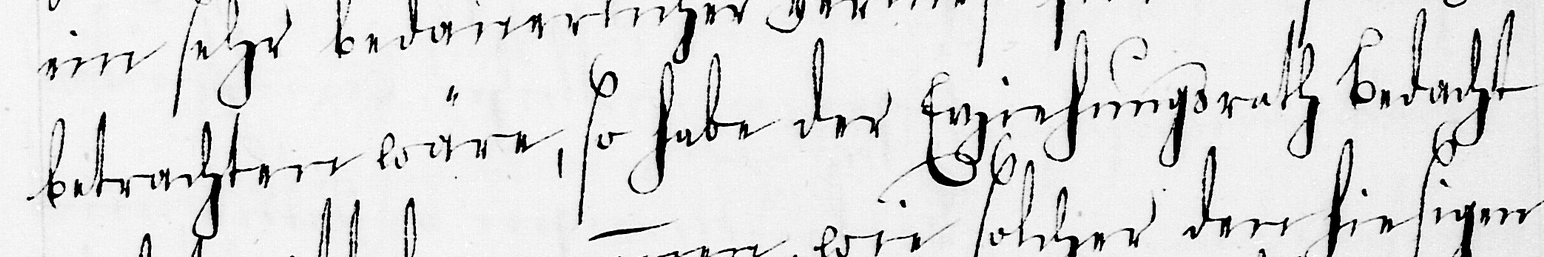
betrachten wäre, so habe der Erziehungsrath Bedacht
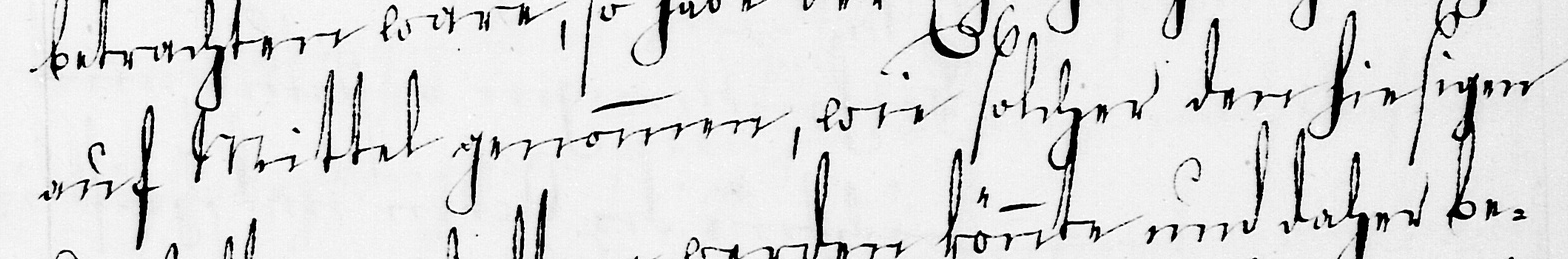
auf Mittel genommen, wie solcher den hiesigen
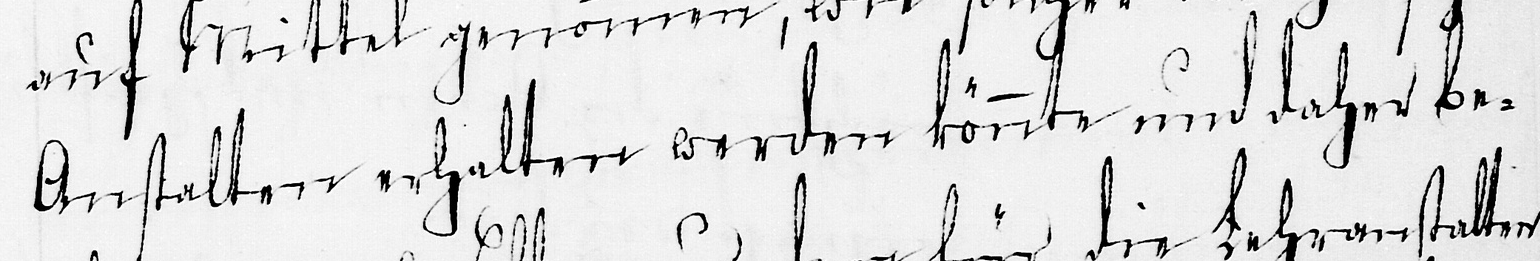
Anstalten erhalten werden könnte und daher bes¬
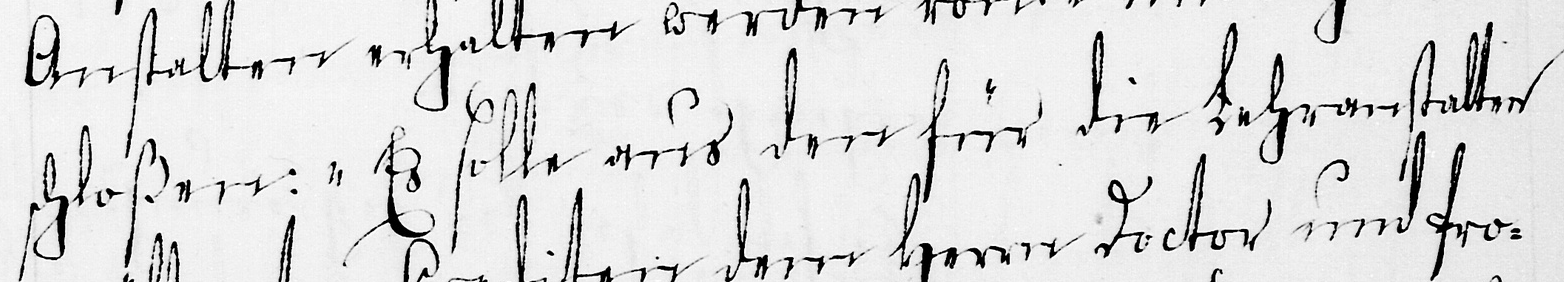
chloßen: „Es solle aus den für die Lehranstalten
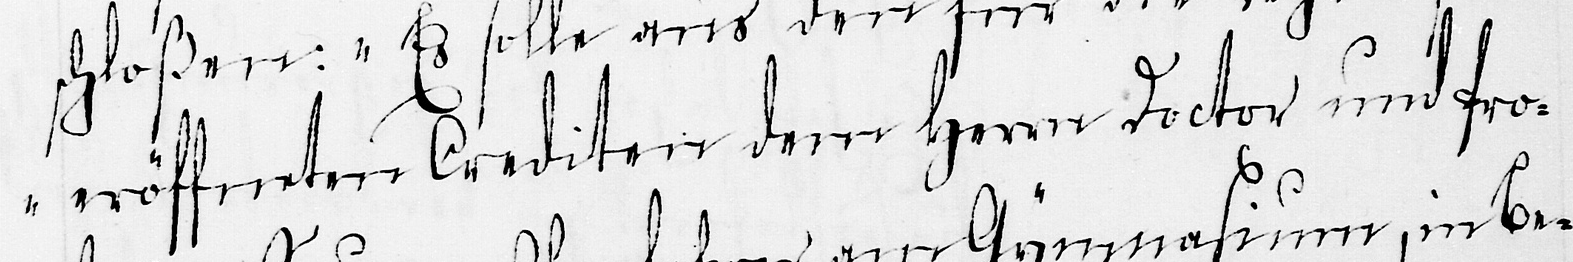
eröffneten Crediten dem Herrn Doctor und Pro¬
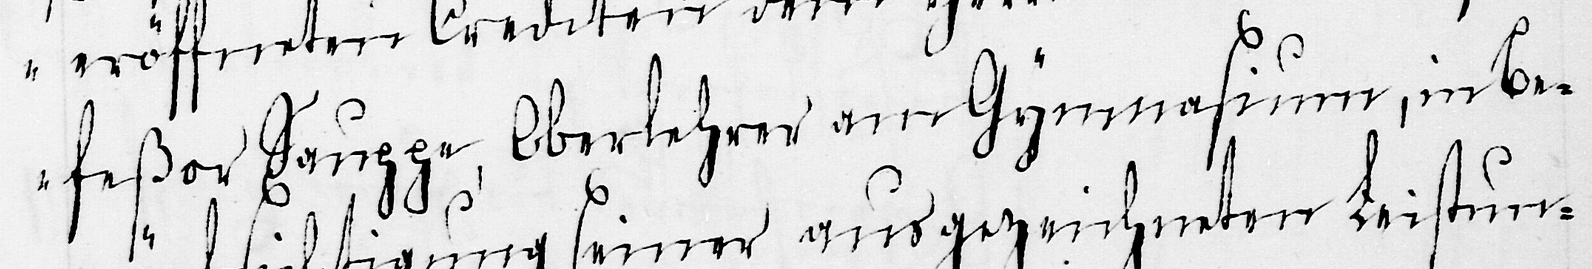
feßor Sauppe, Oberlehrer am Gymnasium, in Be¬
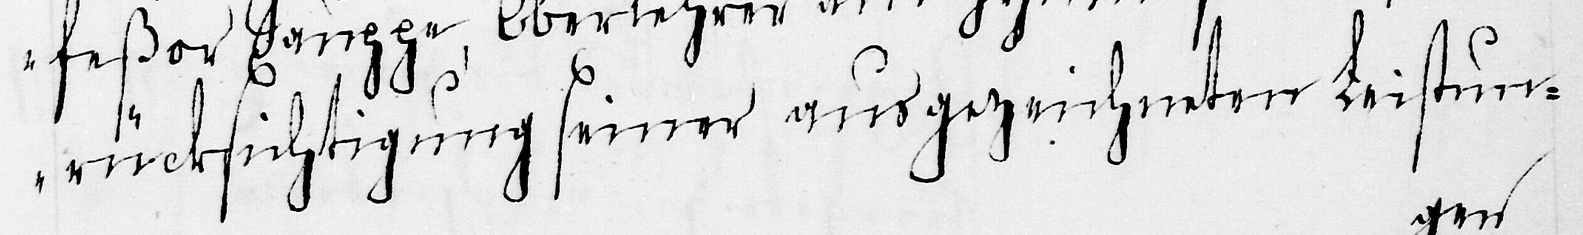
rücksichtigung seiner ausgezeichneten Leistun-
